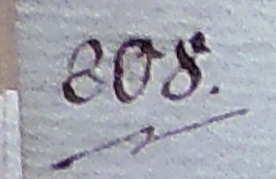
208.
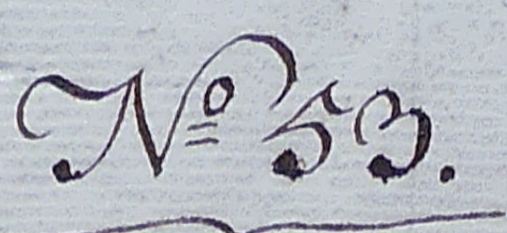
No͇ 53.
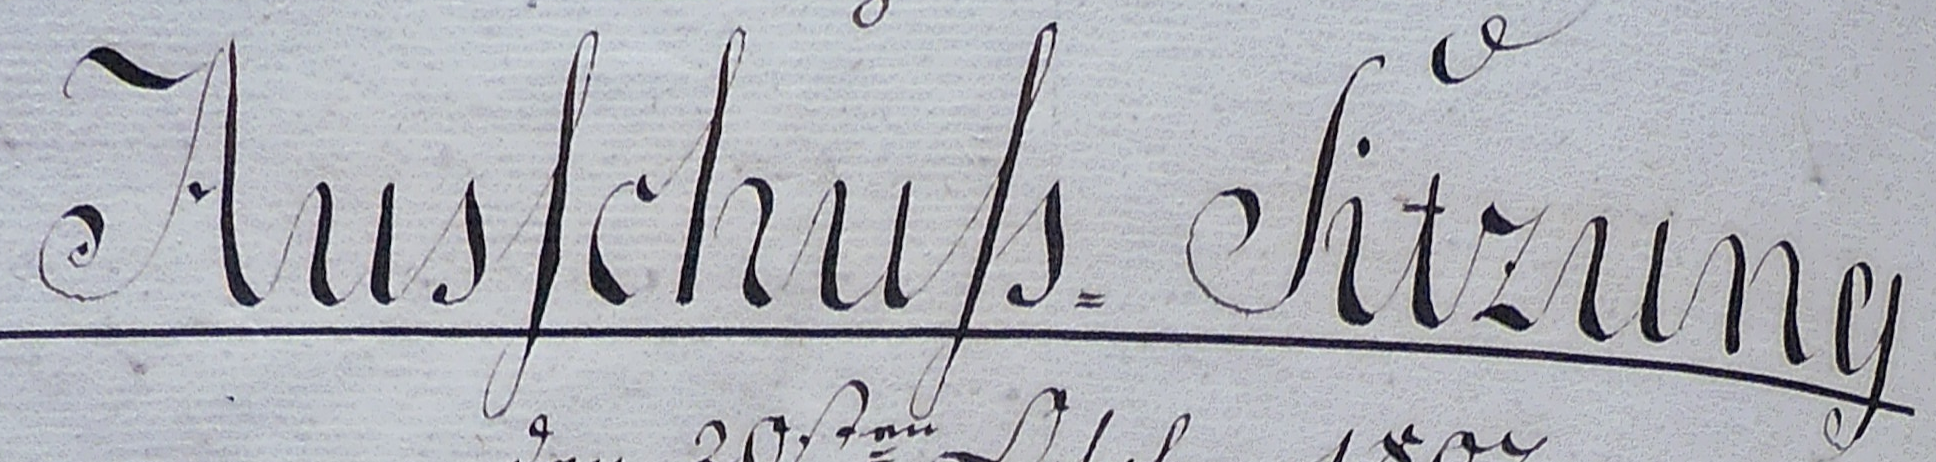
Ausschuss‗Sitzung
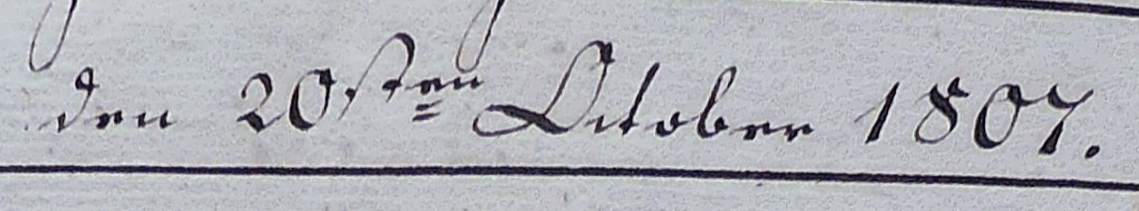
den 20ste͇n October 1807.
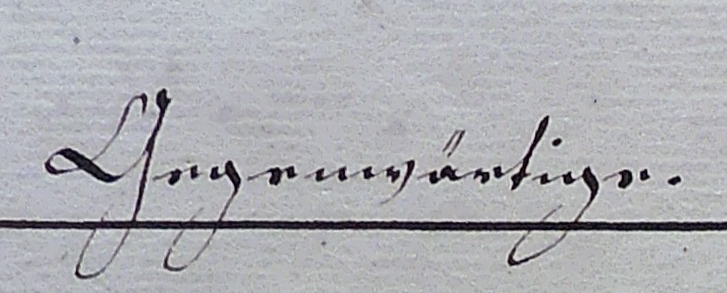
Gegenwärtige.
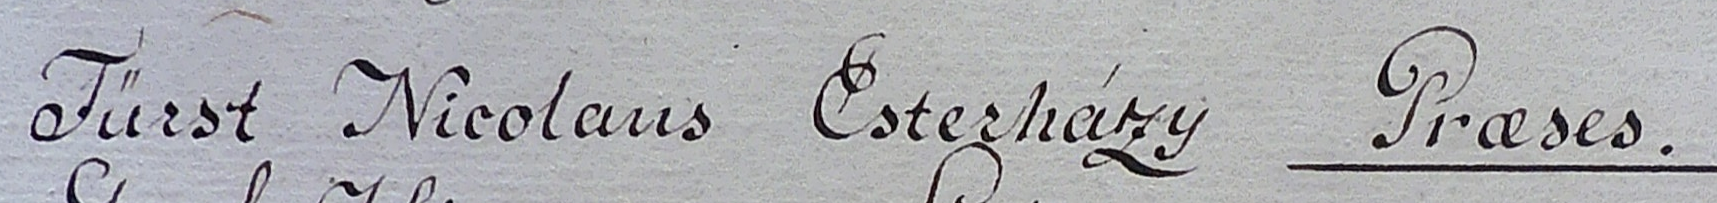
Fürst Nicolaus Esterházy Præses.
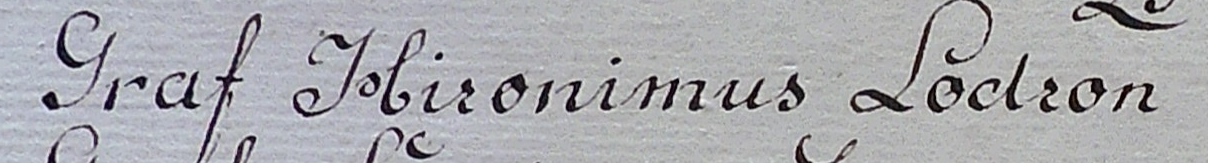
Graf Hironimus Lodron
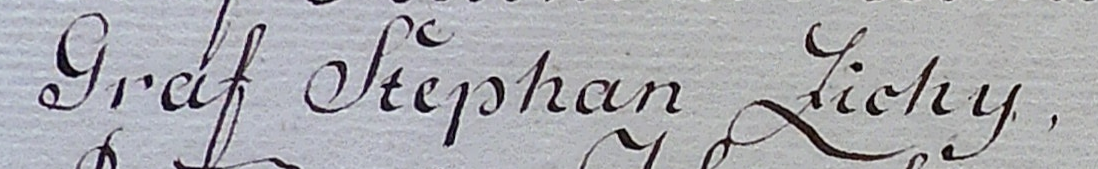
Graf Stephan Zichy,
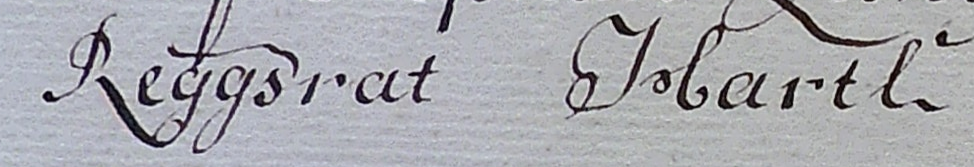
Reg͞gsrath Hartl
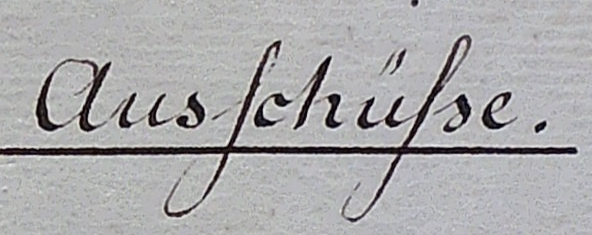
Ausschüsse.
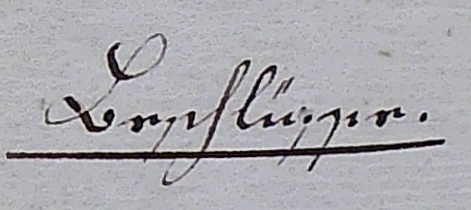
Beschlüsse.
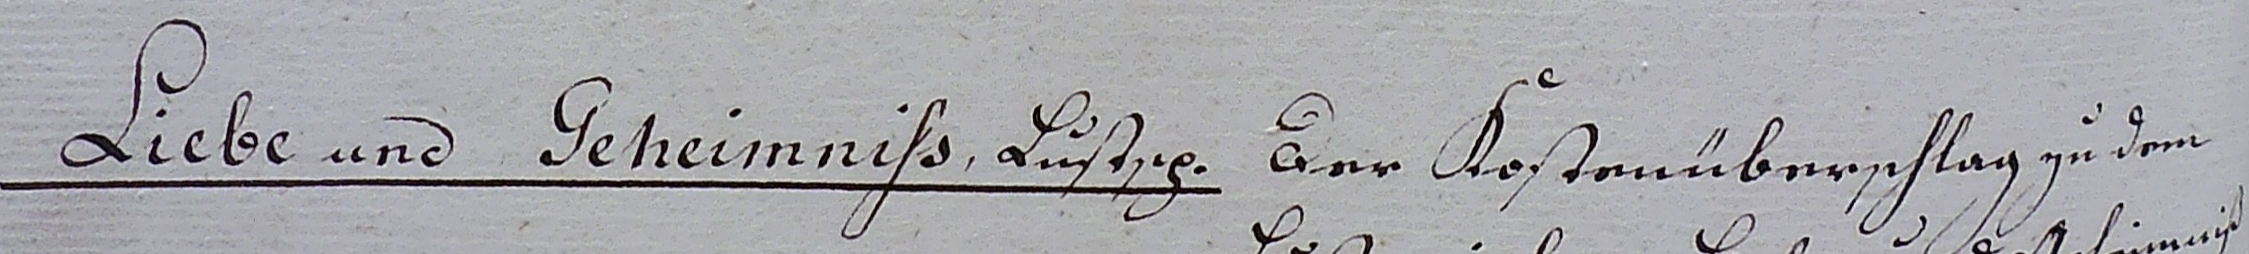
Liebe und Geheimniss, Lustsp. Der Kostenüberschlag zu dem
